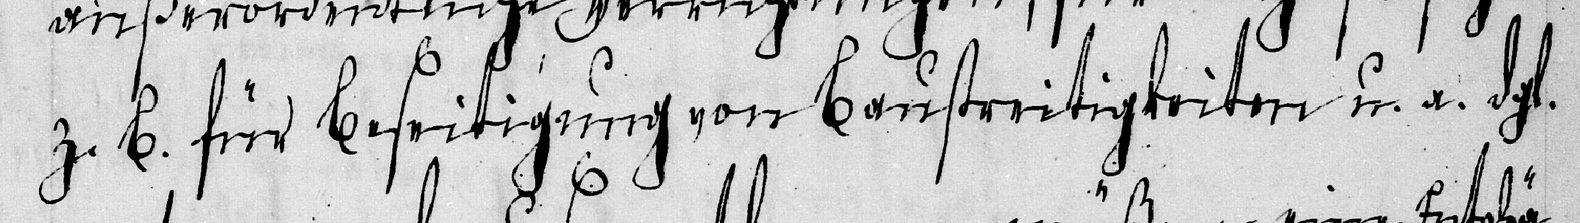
z.B. für Beseitigung von Baustreitigkeiten u. a. dgl.
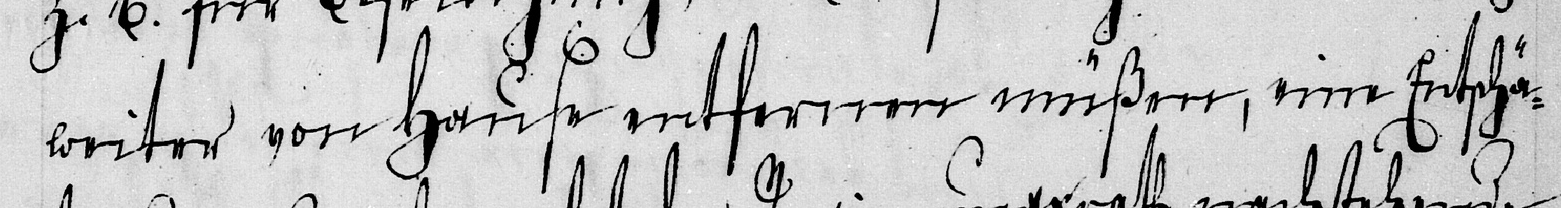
weiter von Hause entfernen müßen, eine Entschä¬
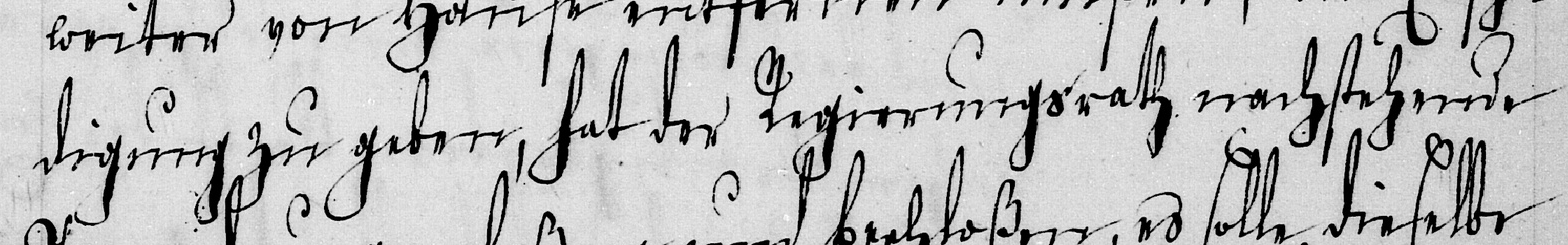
digung zu geben, hat der Regierungsrath nachstehende
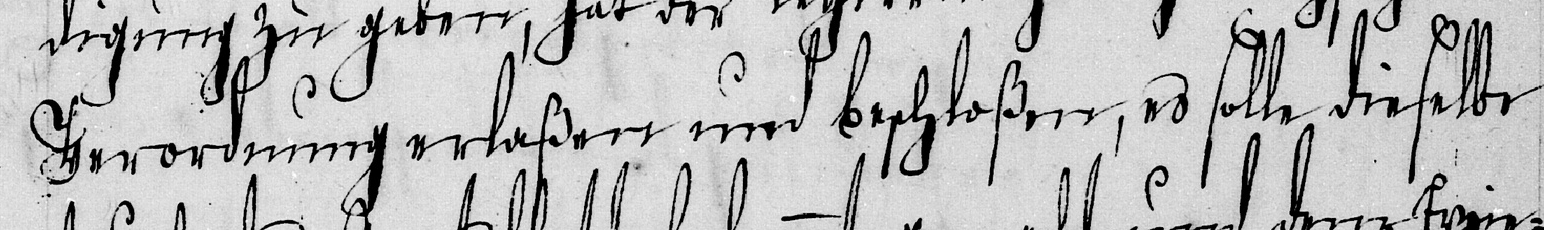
Verordnung erlaßen und beschloßen, es solle dieselbe
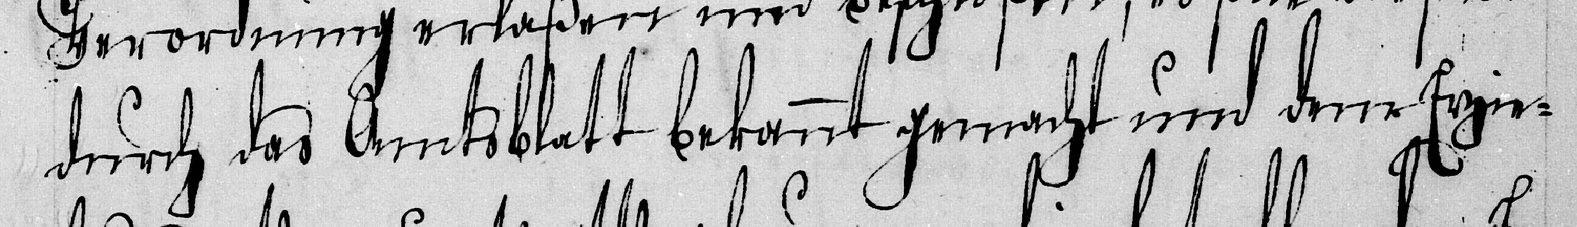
durch das Amtsblatt bekannt gemacht und dem Erzie¬
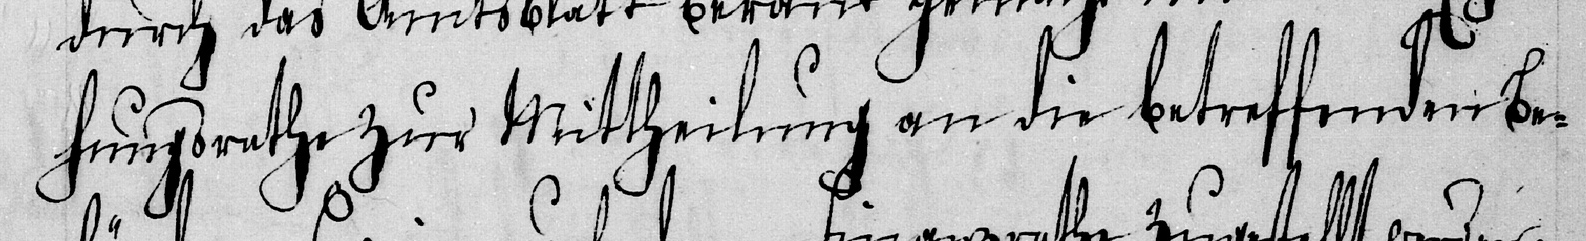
hungsrathe zur Mittheilung an die betreffenden Be¬
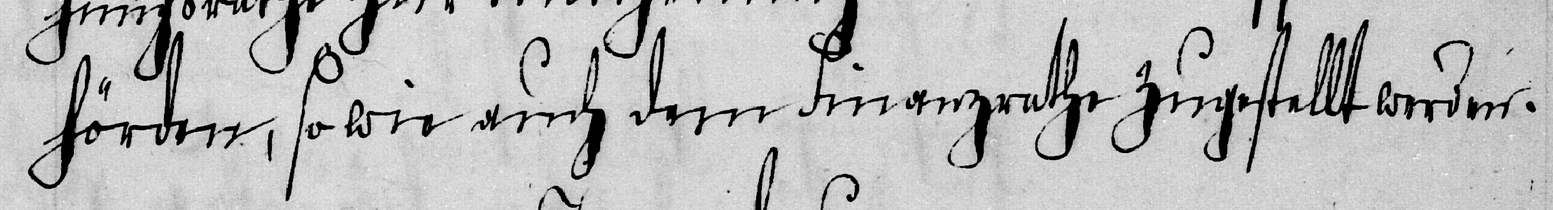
hörden, sowie auch dem Finanzrathe zugestellt werden.
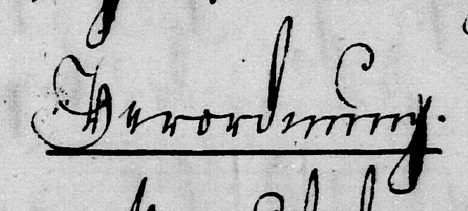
Verordnung
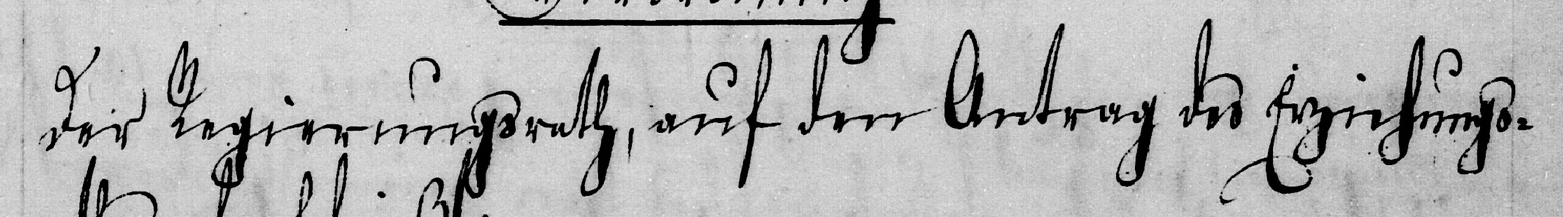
Der Regierungsrath, auf den Antrag des Erziehungs¬
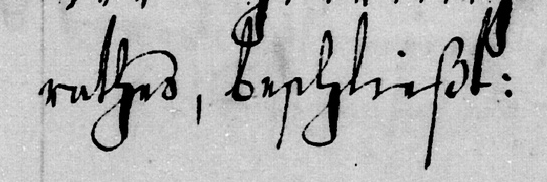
rathes, beschließt:
